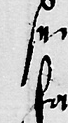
so
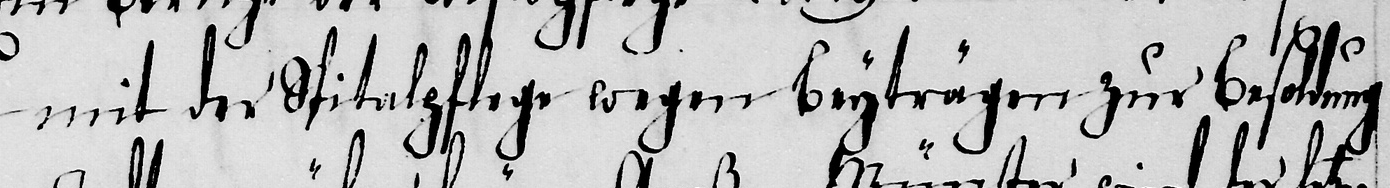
mit der Spitalpflege wegen Beyträgen zur Besoldung
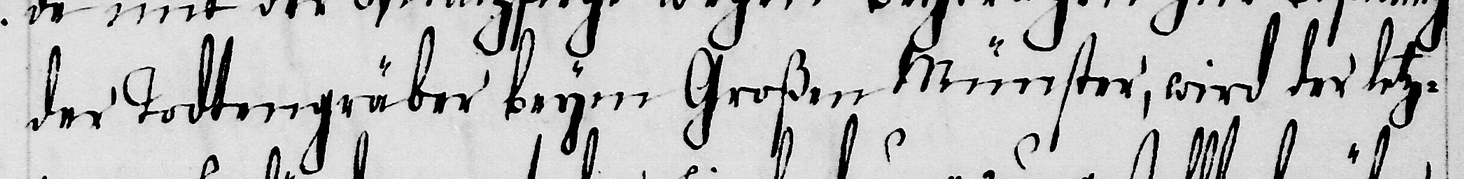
der Todtengräber beym Großen Münster, wird der letz¬
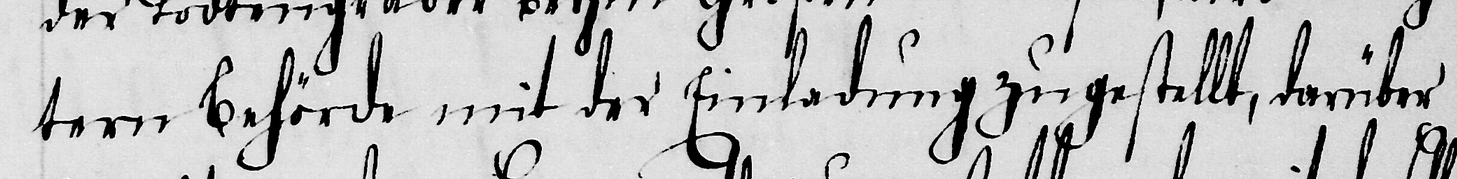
tern Behörde mit der Einladung zugestellt, darüber
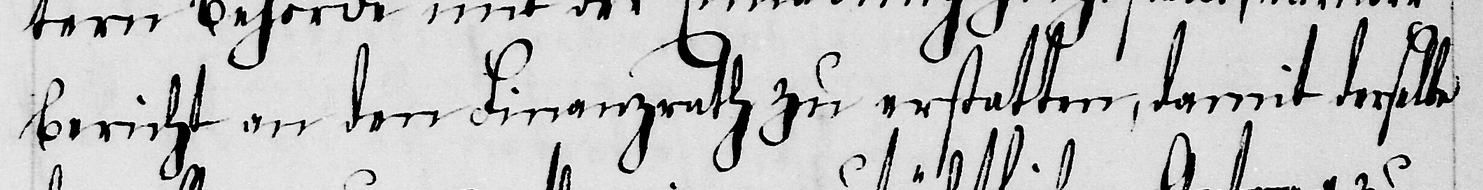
Bericht an den Finanzrath zu erstatten, damit derselbe
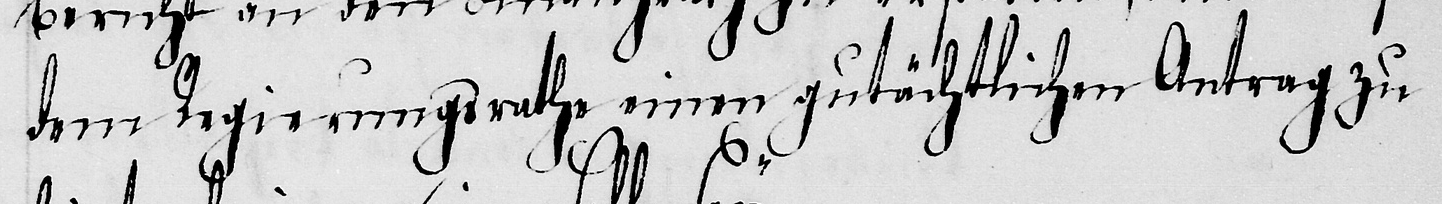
dem Regierungsrathe einen gutächtlichen Antrag zu
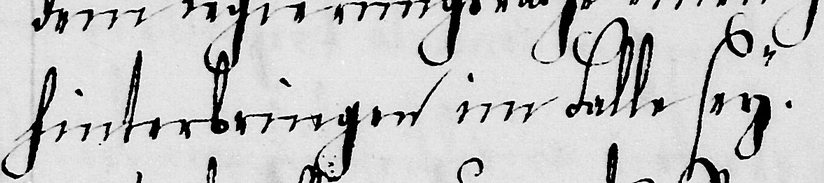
hinterbringen im Falle sey.
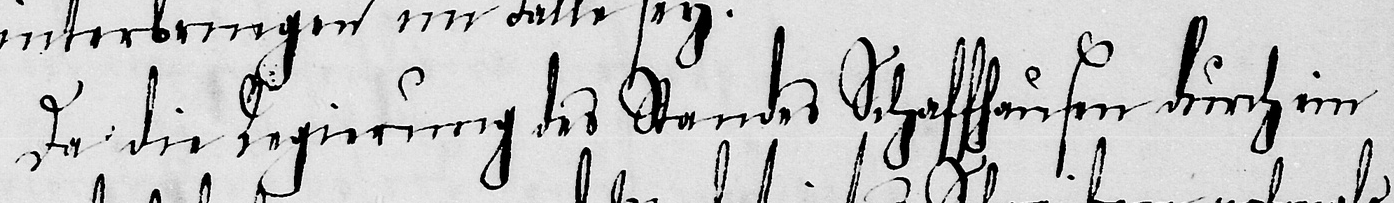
Da die Regierung des Standes Schaffhausen durch ein
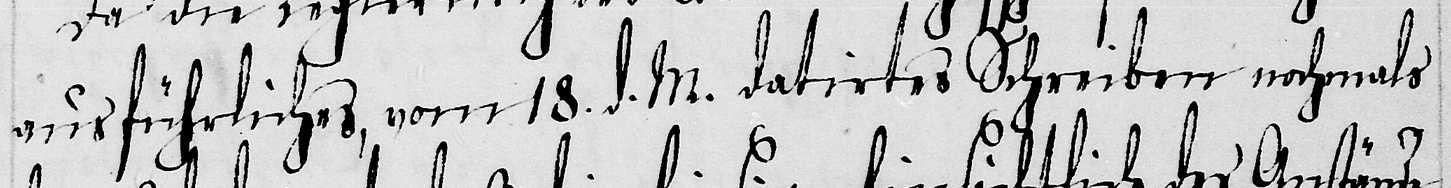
ausführliches, vom 18. d. M. datirtes Schreiben nochmals
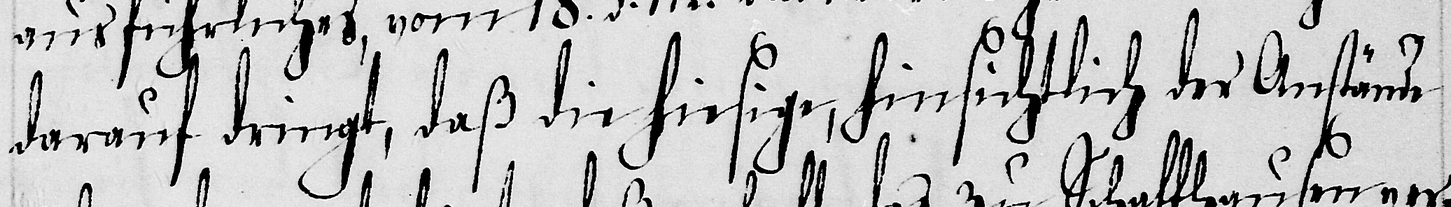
darauf dringt, daß die hiesige, hinsichtlich der Anstände
